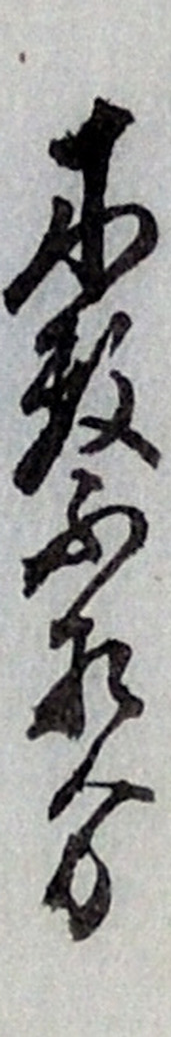木数不相分
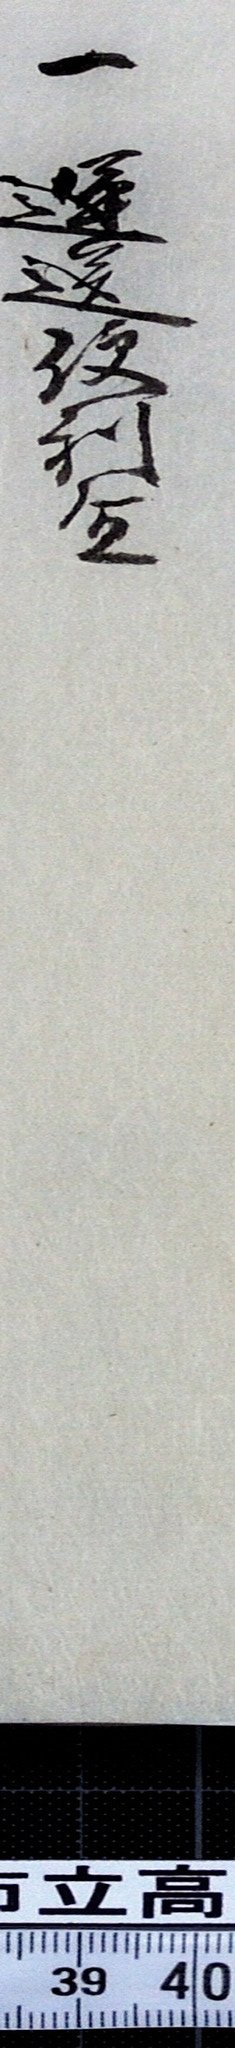一運送便利宜
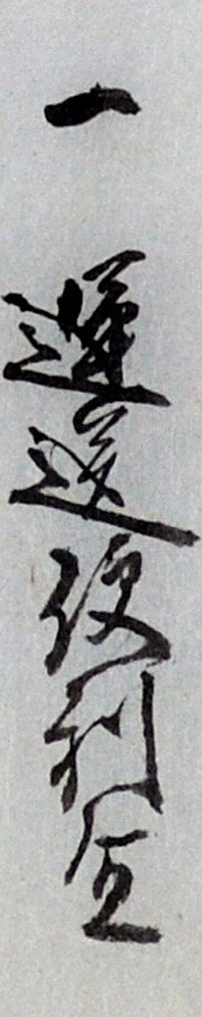一運送便利宜
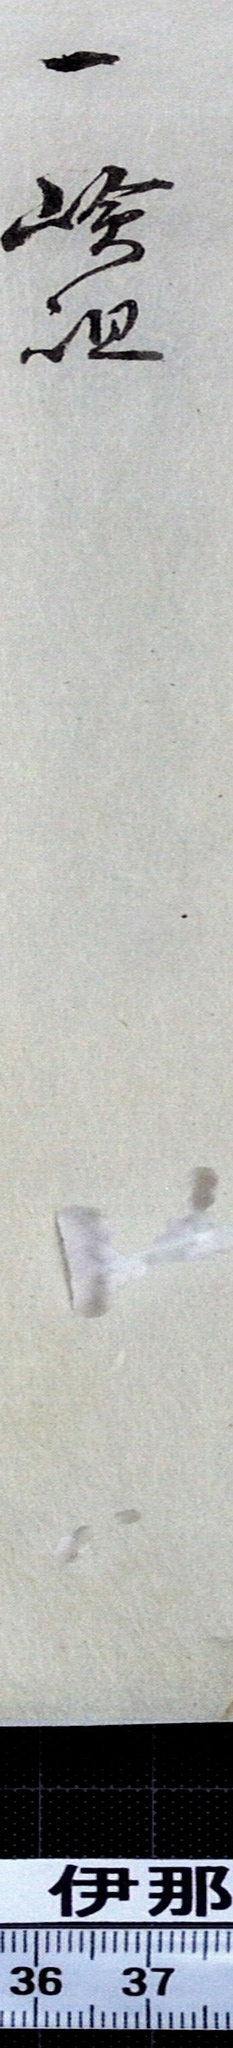一嶮岨
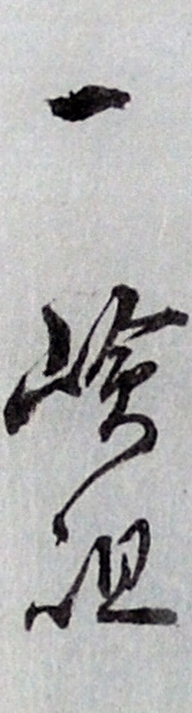一嶮岨

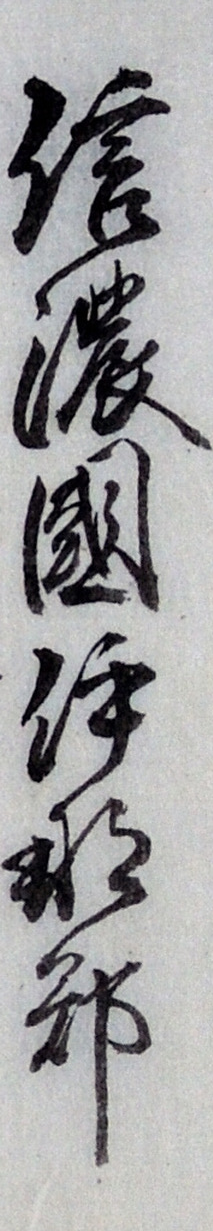信濃国伊那郡
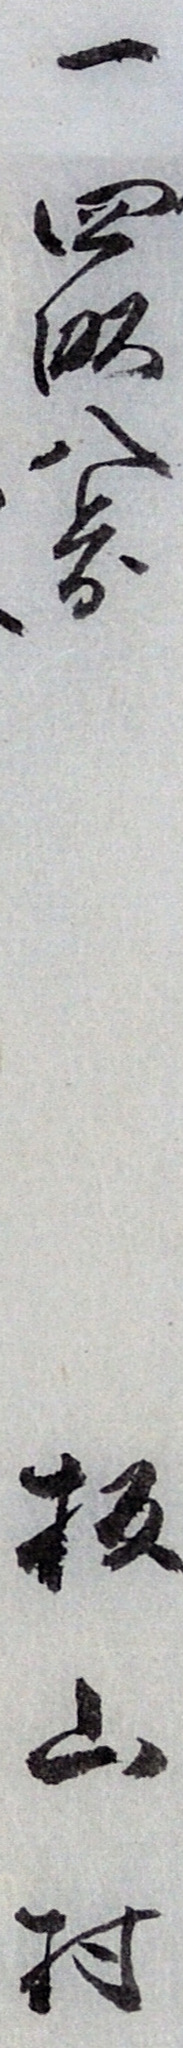一四㽗八歩板山村
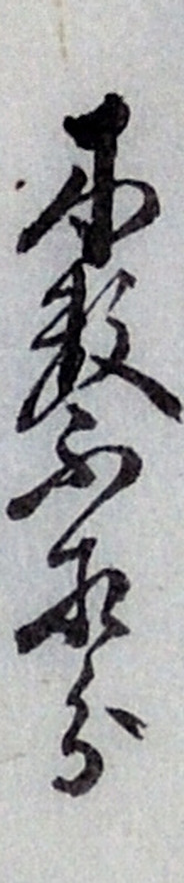木数不相分
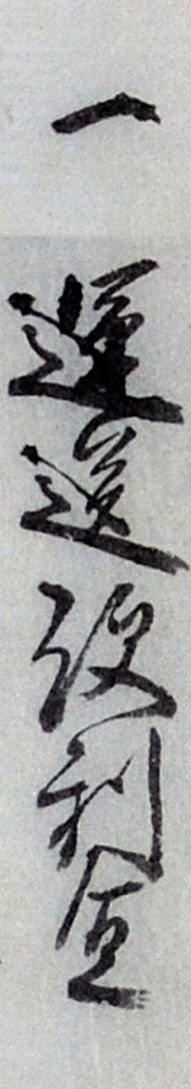一運送便利宜
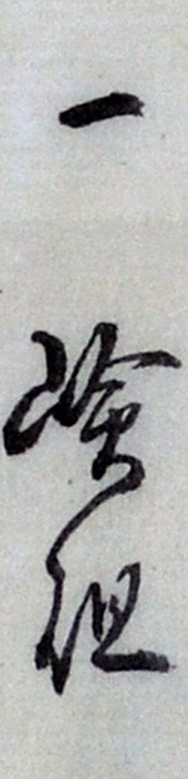一嶮岨
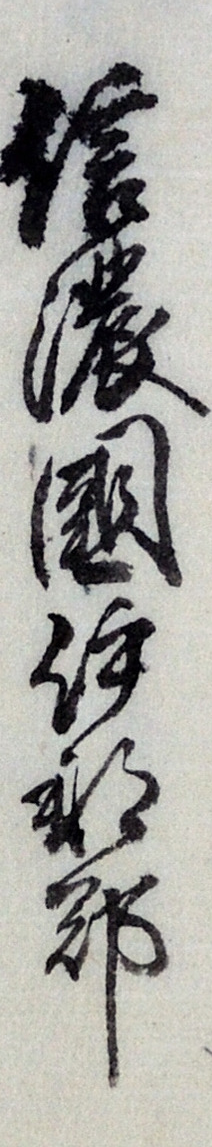信濃国伊那郡
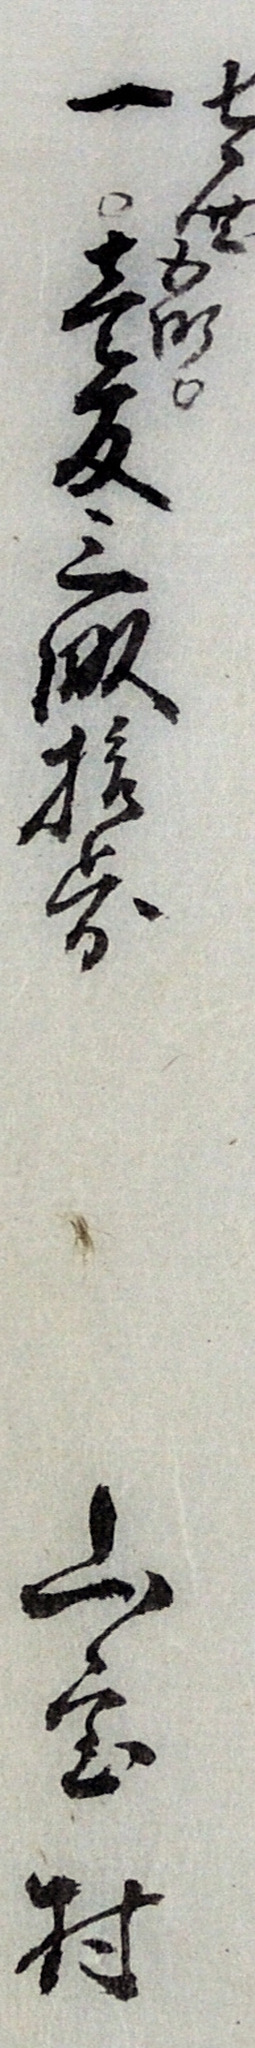一壱反三㽗拾歩山室村
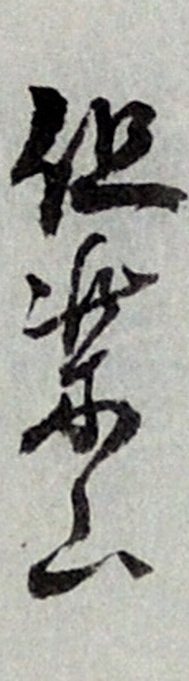但柴山
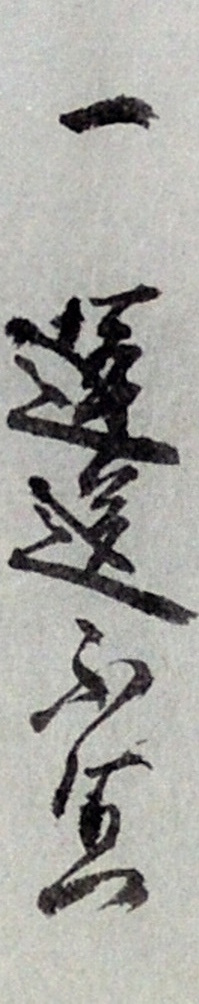一運送不宜
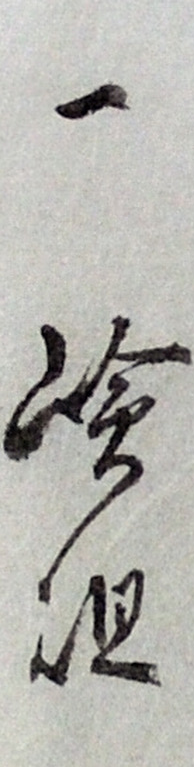一嶮岨

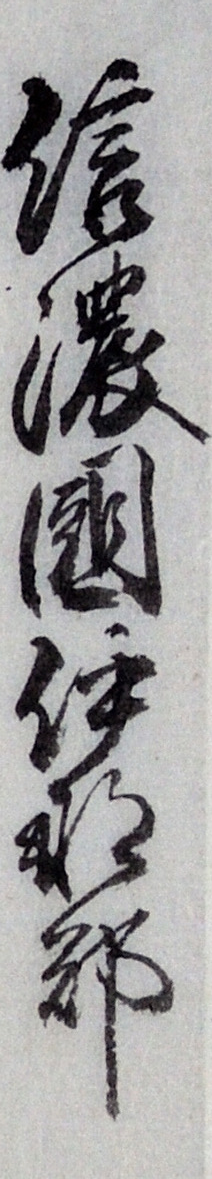信濃国伊那郡
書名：官林反別帳
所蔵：伊那市立高遠町図書館・合同会社AMANE
